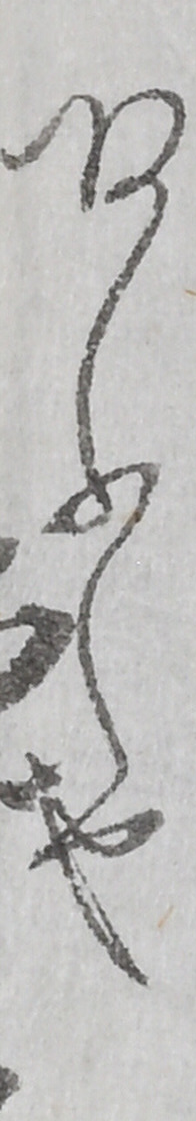あふしや
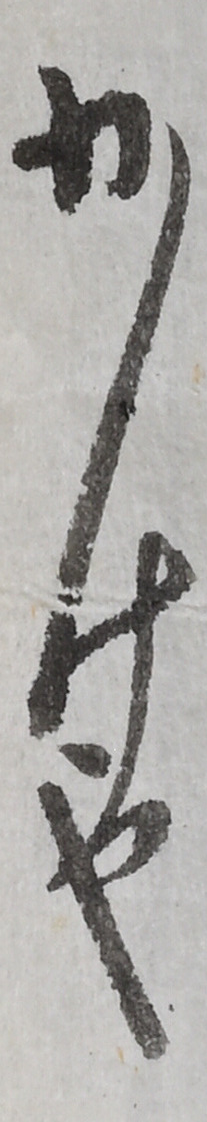かじや
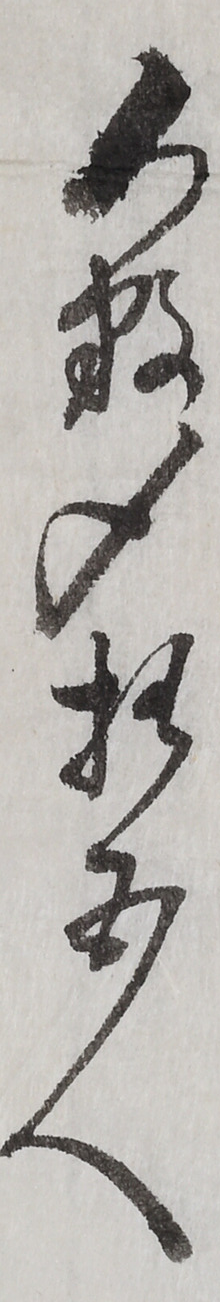人数〆拾五人
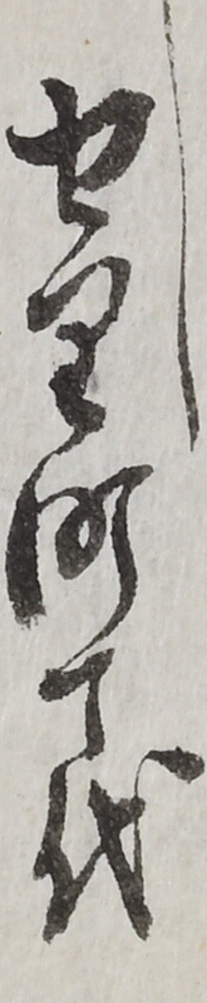せり町丁代
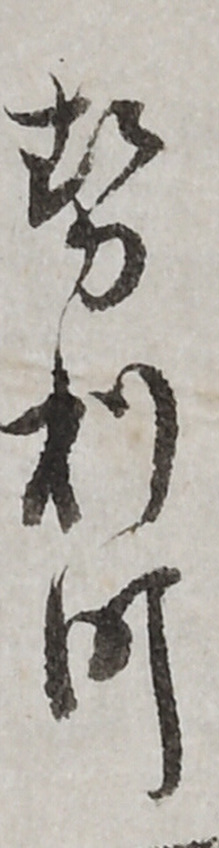勢利町
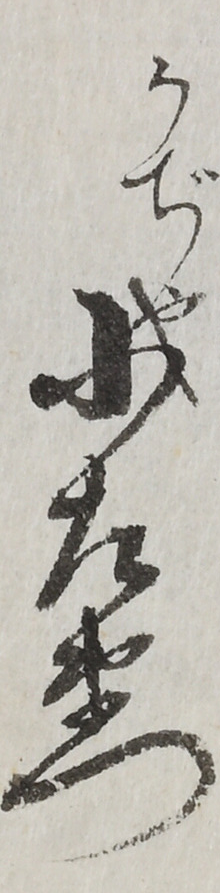小左衛門
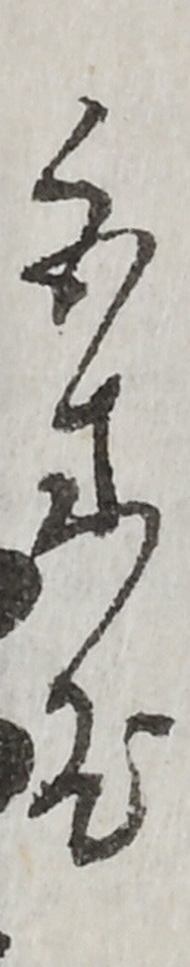白木屋

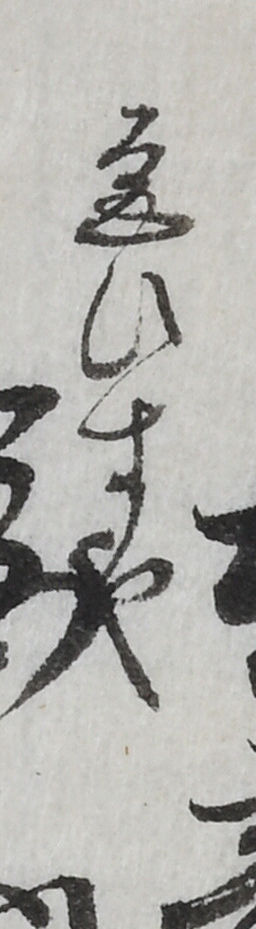ゑひすや
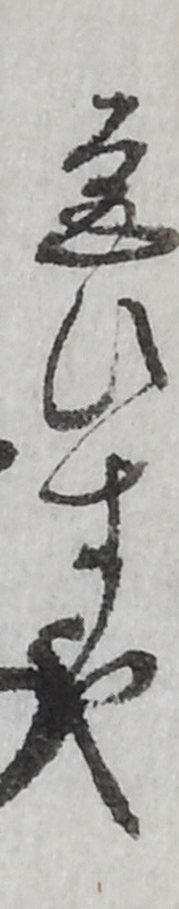ゑひすや
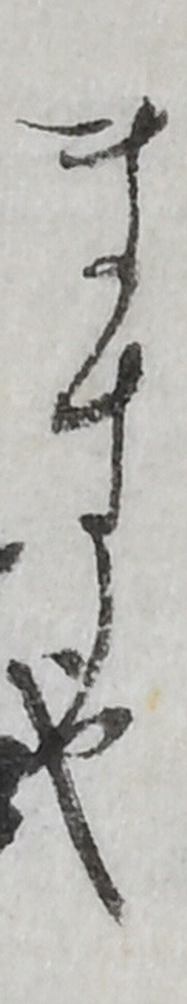ますや
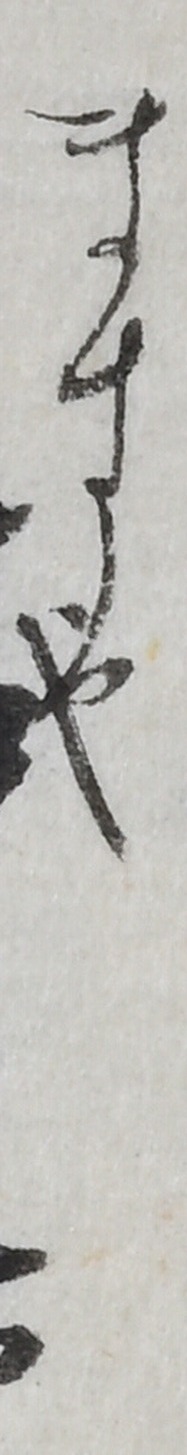ますや
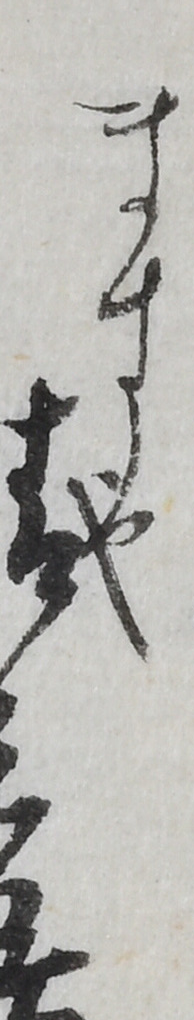ますや
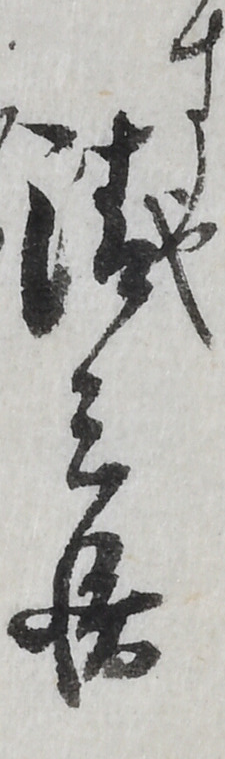清兵衛
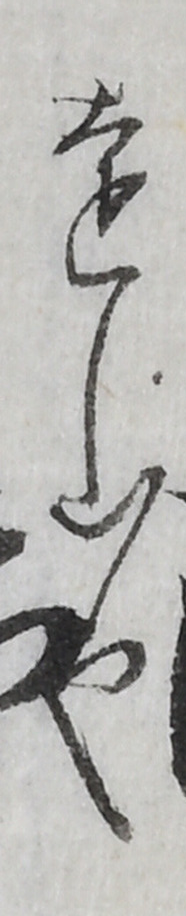遠山や
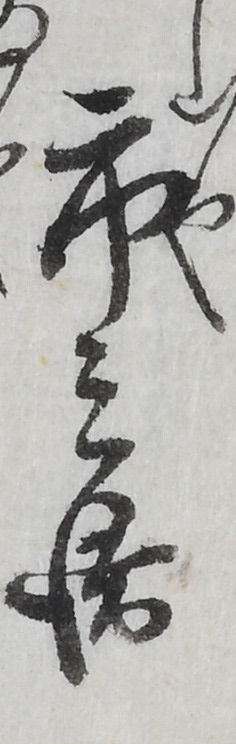市兵衛
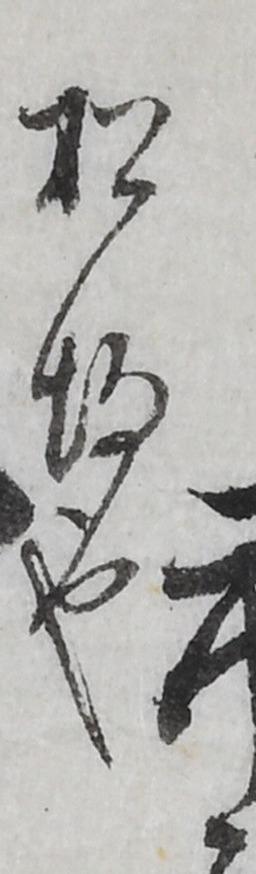松坂や
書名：當町火消道具幷役附帳
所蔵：伊那市立高遠町図書館・合同会社AMANE
